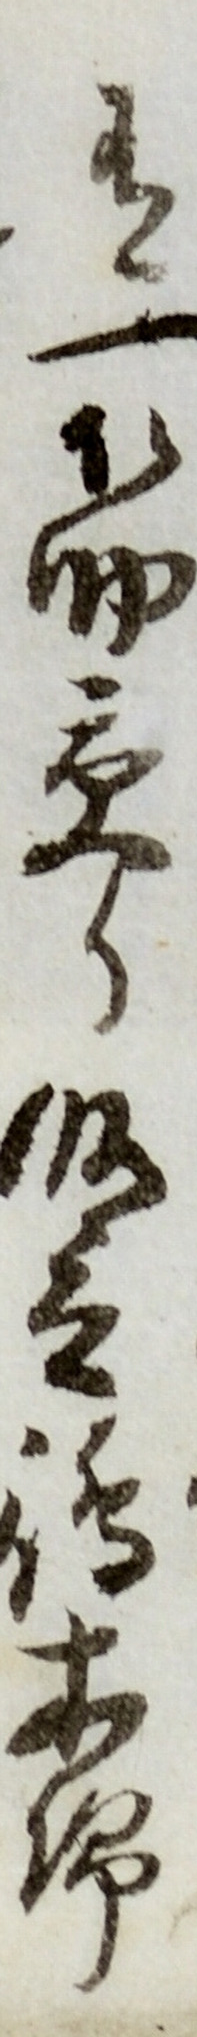有一筋交り明立嶋木綿
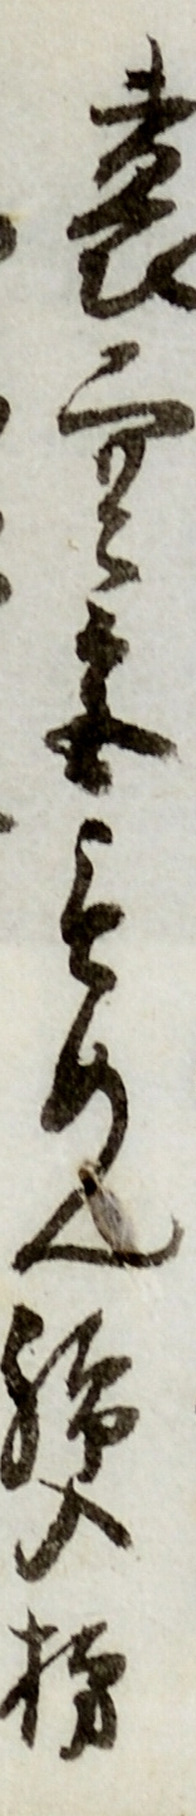裏空色もめん綿入柿
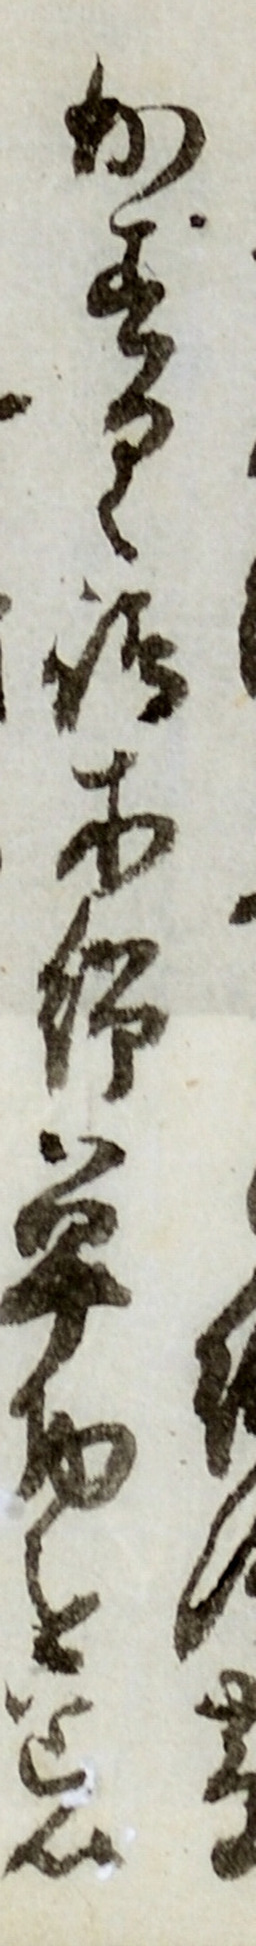かすり嶋木綿単物を着
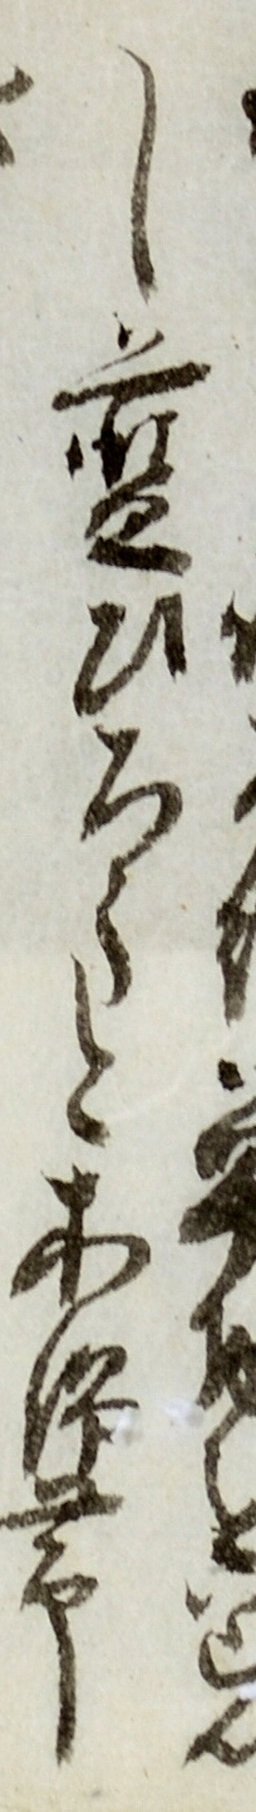し藍ひろうと木綿帯
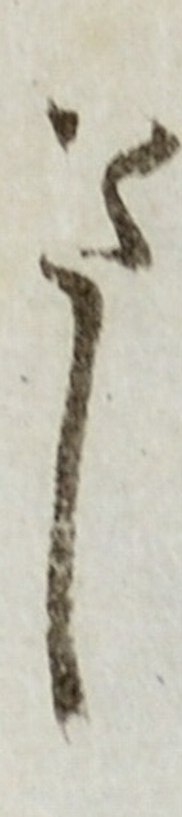いたし
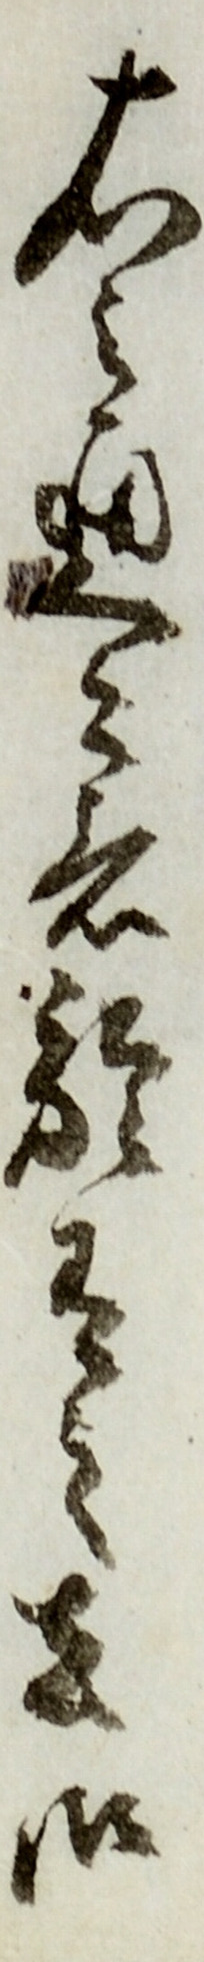右之通之者於有之は御
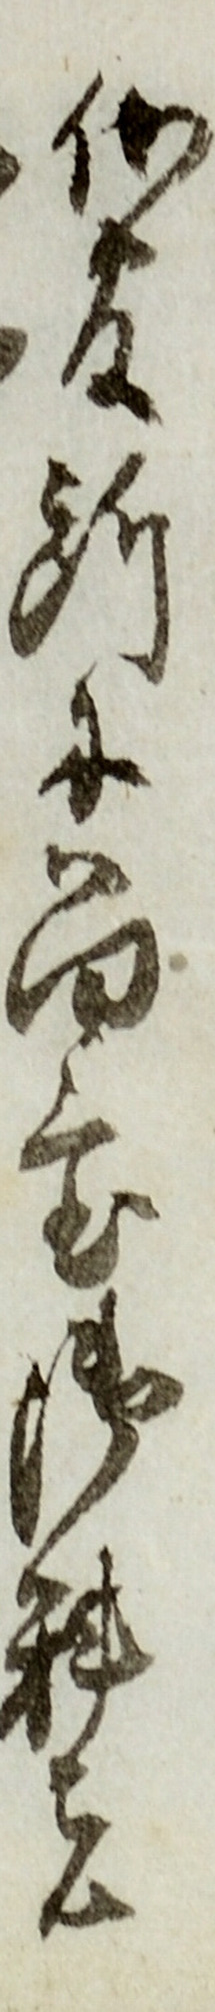代官所に留置御料は
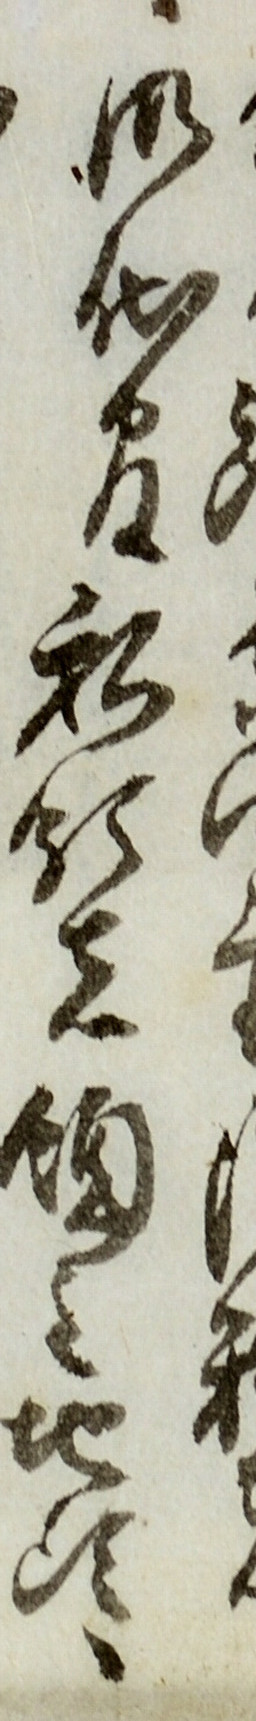御代官私領は領主地頭へ
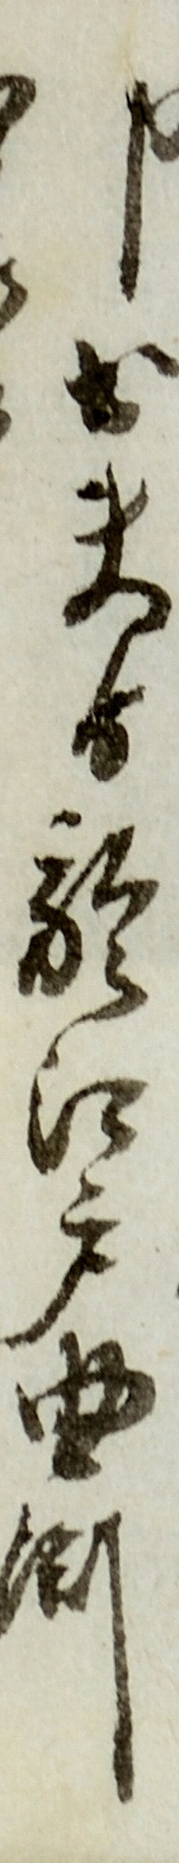申出夫より於江戸曲淵
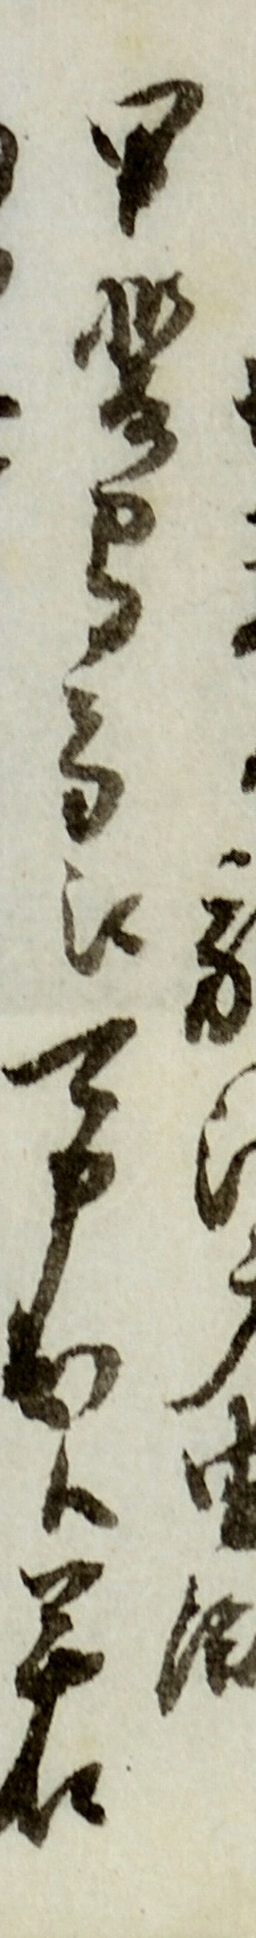甲斐守殿え可申出候若
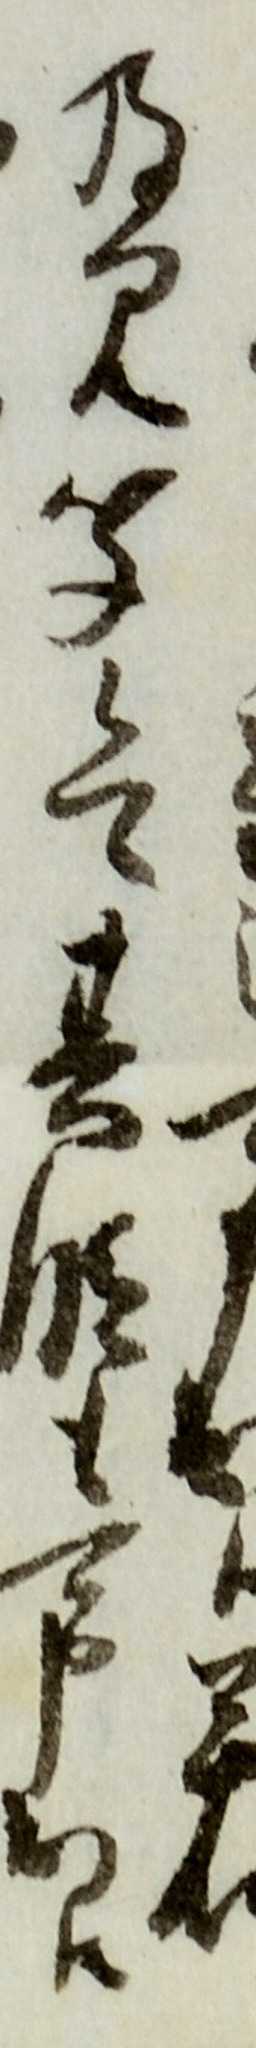及見聞候はゝ其段も可申出候
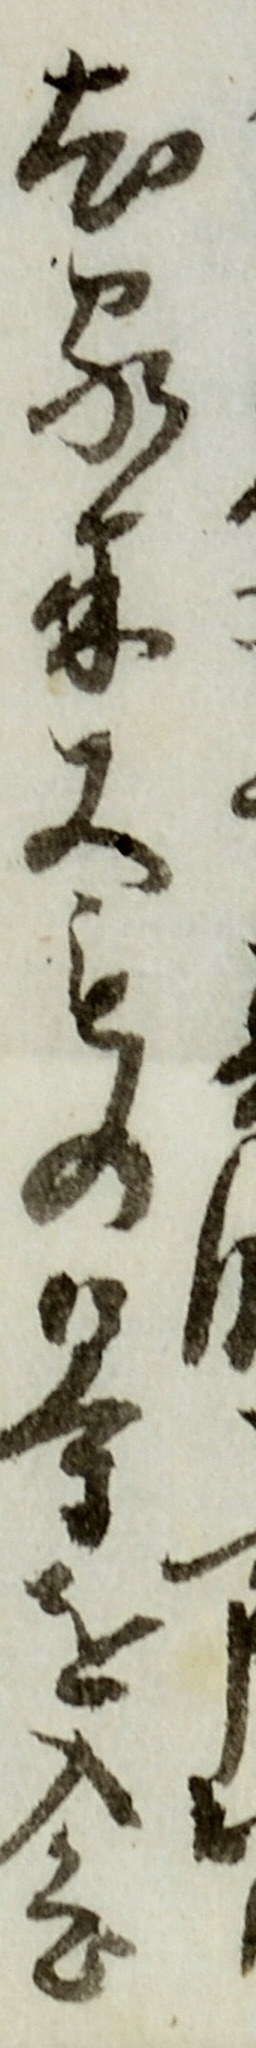尤家来又もの等を入念
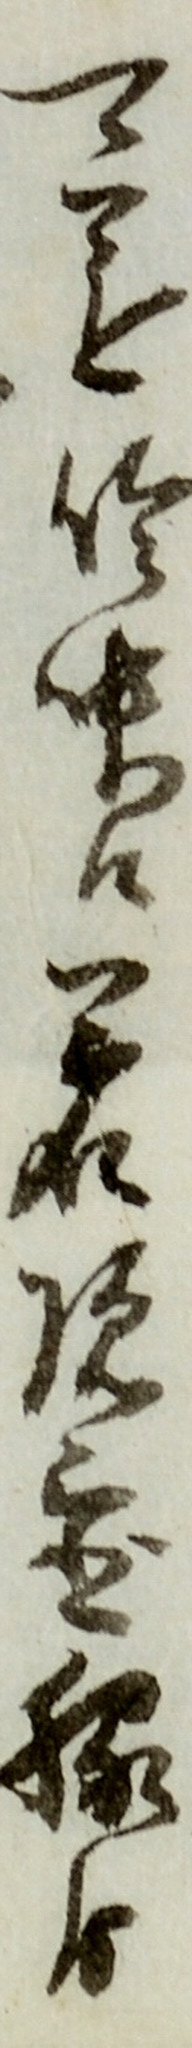可遂吟味候若隠置脇より
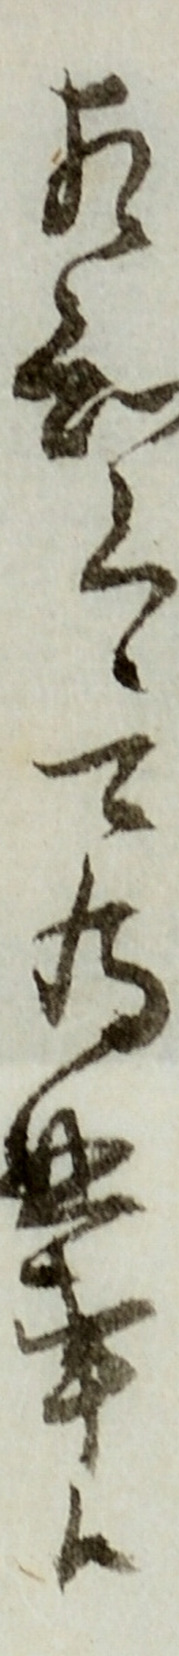相知候はゝ可為曲事候
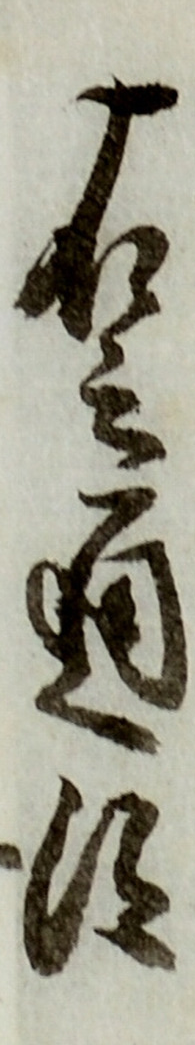右之通従
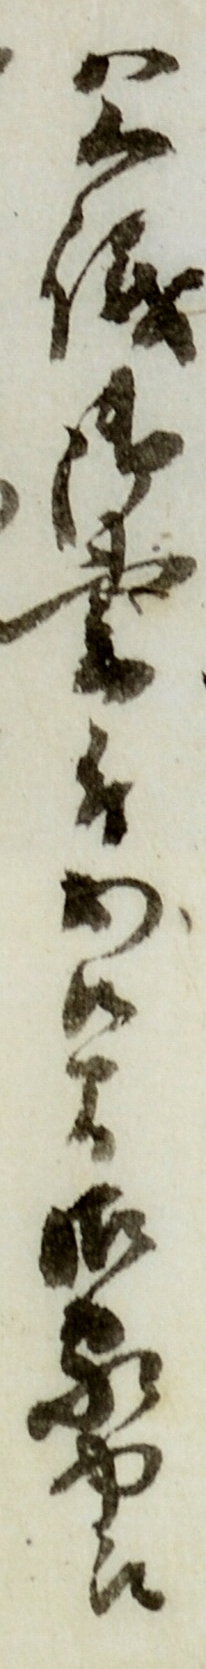公儀御書付出候間御家中え
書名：諸事御用留帳
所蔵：伊那市立高遠町図書館・合同会社AMANE
